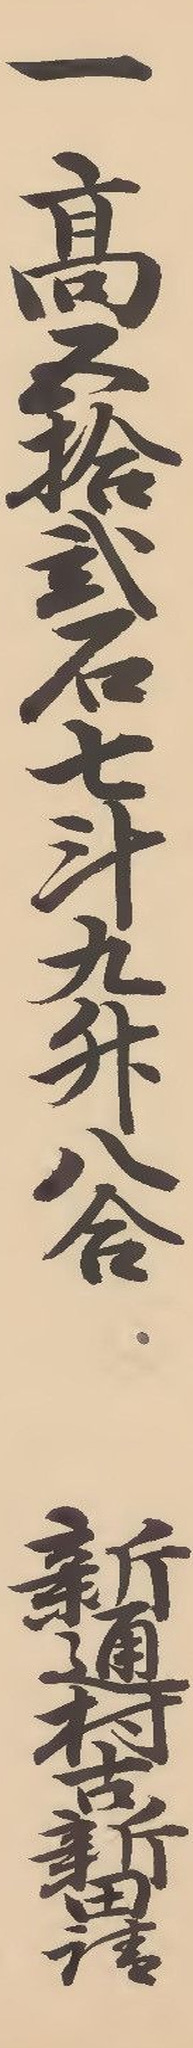一高五拾弐石七斗九升八合新通村古新田請
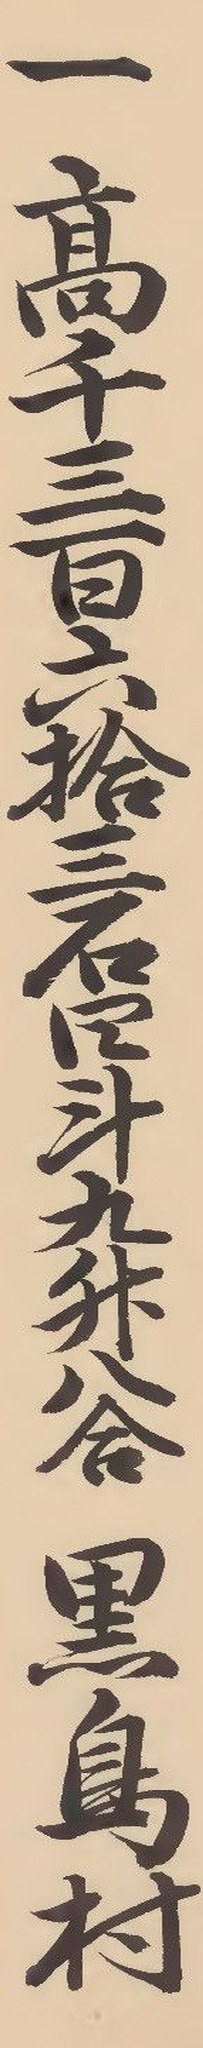一高千三百六拾三石四斗九升八合黒鳥村
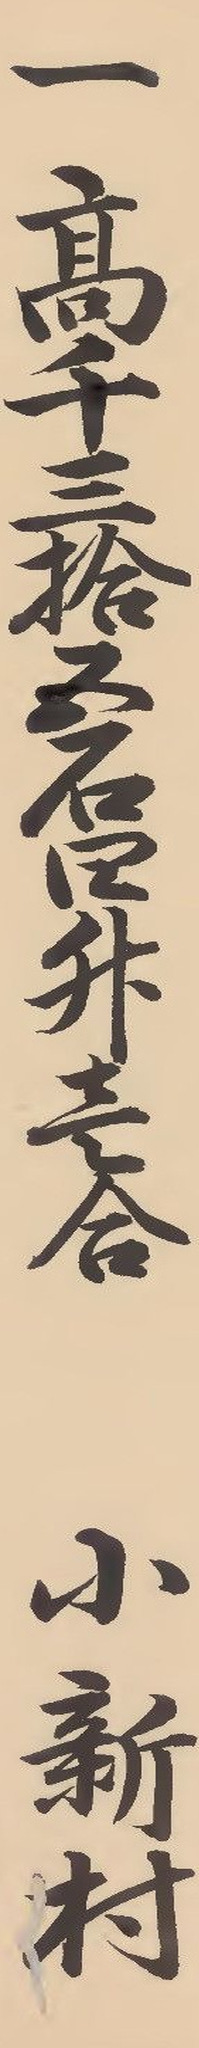一高千三拾五石四升壱合小新村
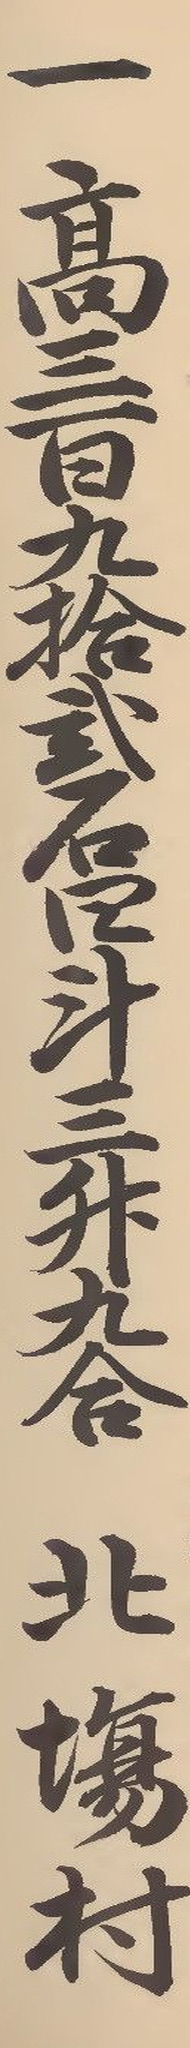一高三百九拾弐石四斗三升九合北場村
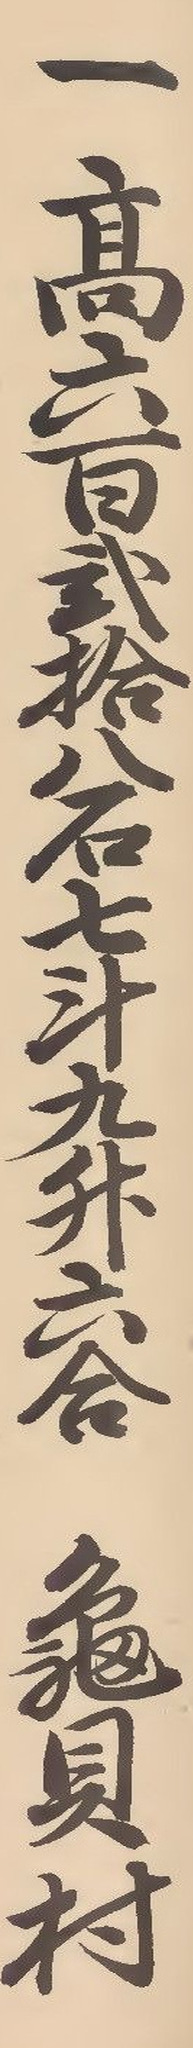一高六百弐拾八石七斗九升六合亀貝村
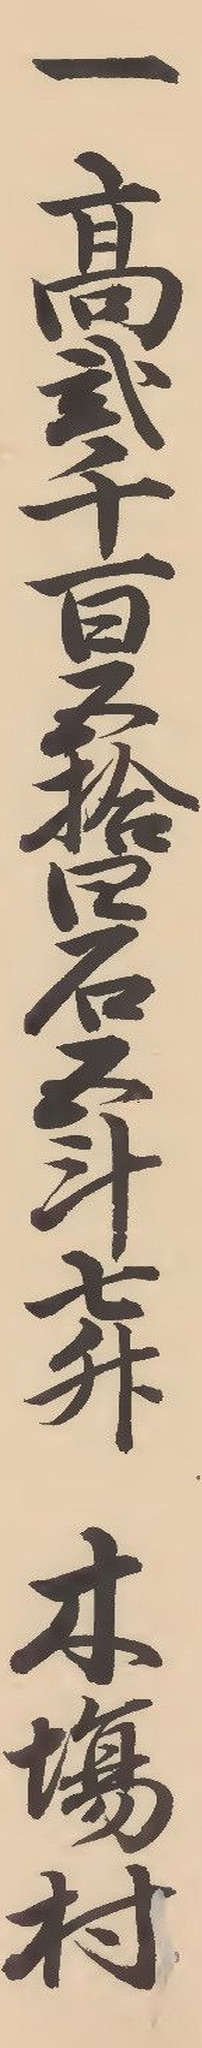一高弐千百五拾四石五斗七升木場村
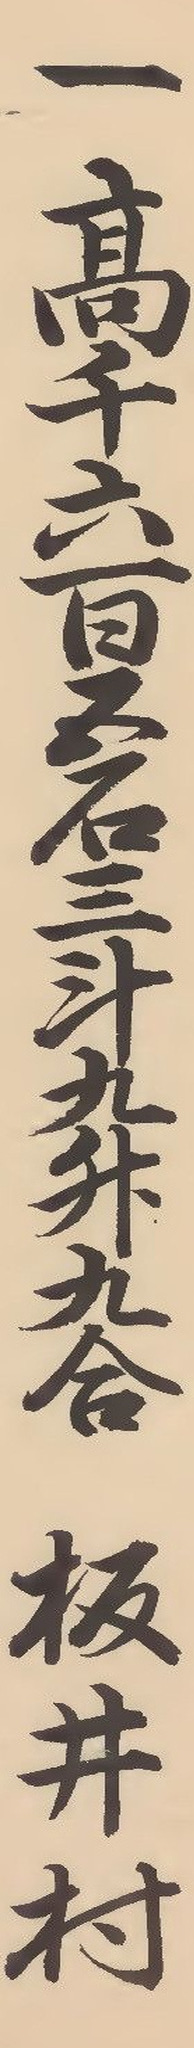一高千六百五石三斗九升九合板井村
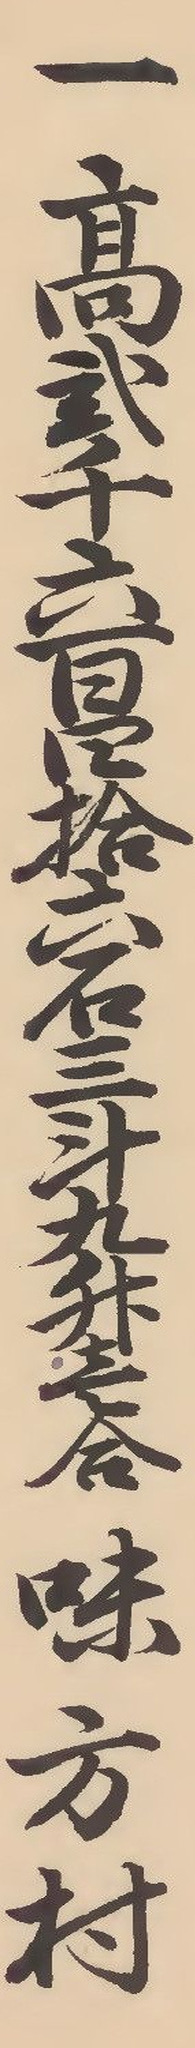一高弐千六百四拾六石三斗九升壱合味方村

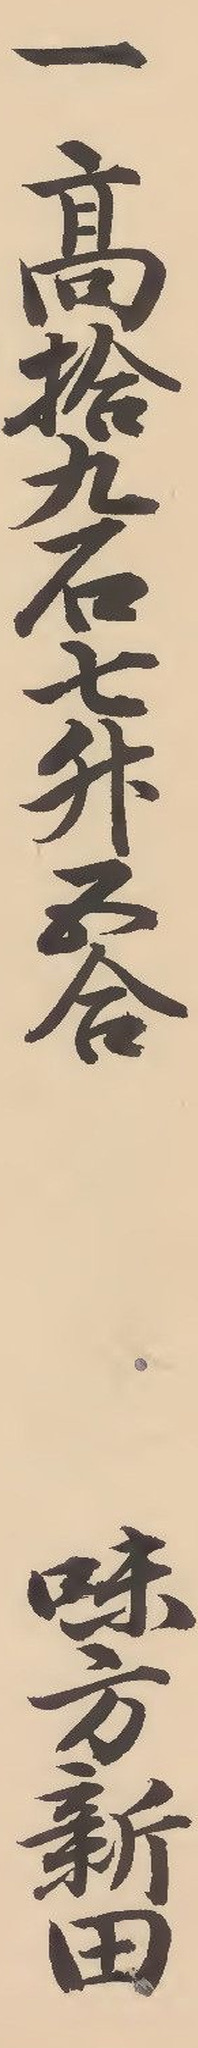一高拾九石七升五合味方新田
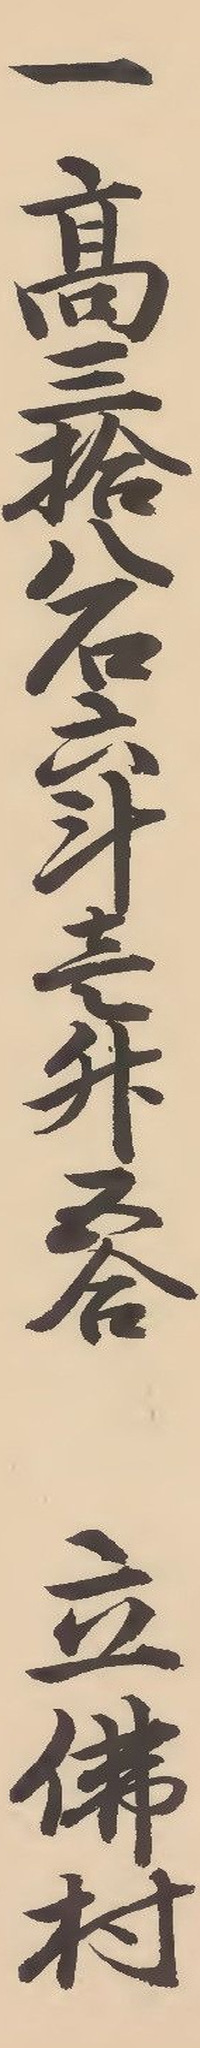一高三拾八石六斗壱升五合立仏村
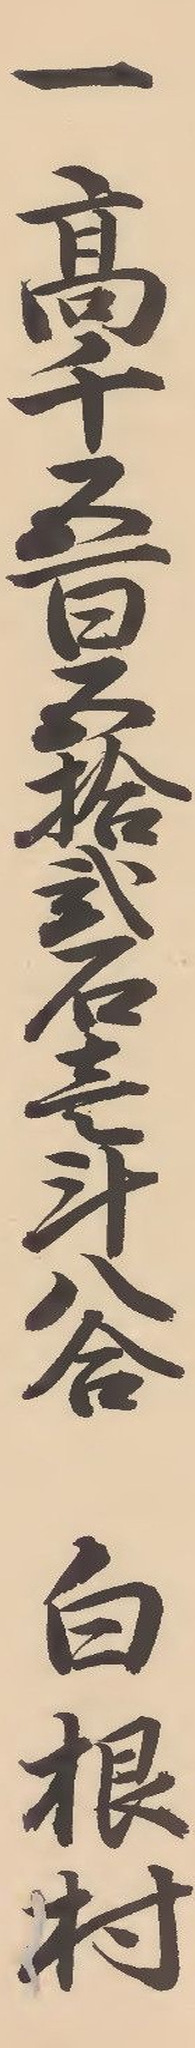一高千五百五拾弐石壱斗八合白根村
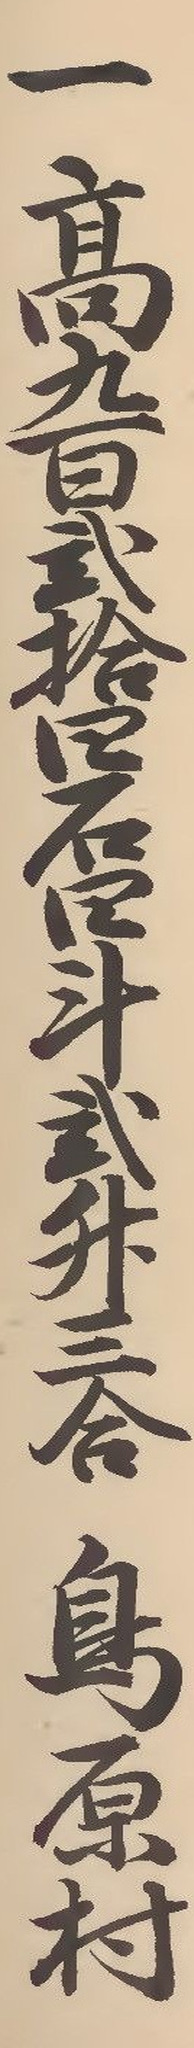一高九百弐拾四石四斗弐升三合鳥原村
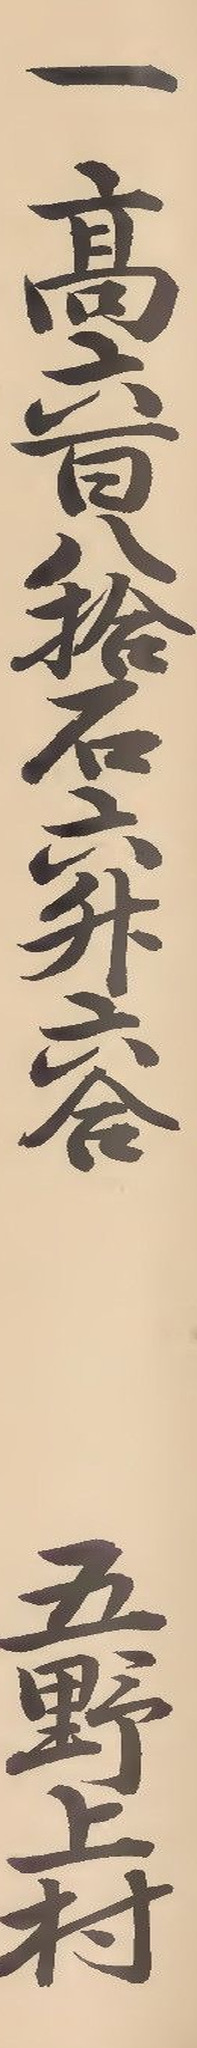一高六百八拾石六升六合五野上村
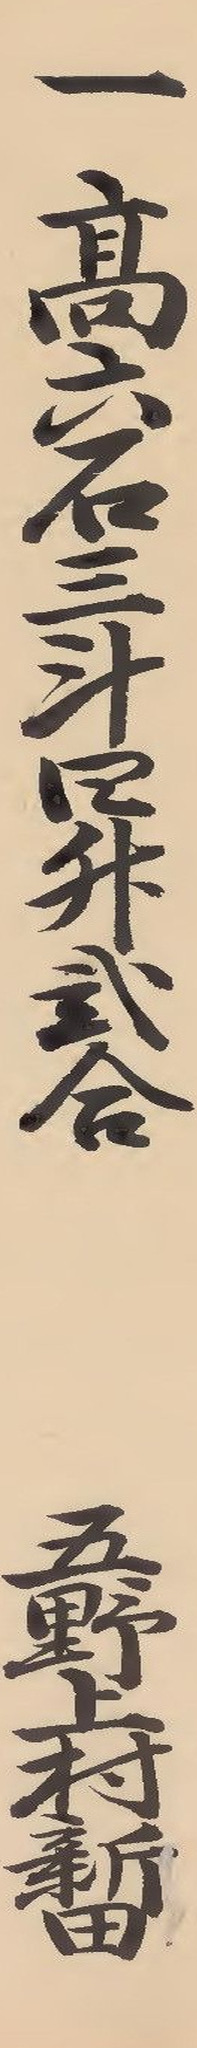一高六石三斗四升弐合五野上村新田
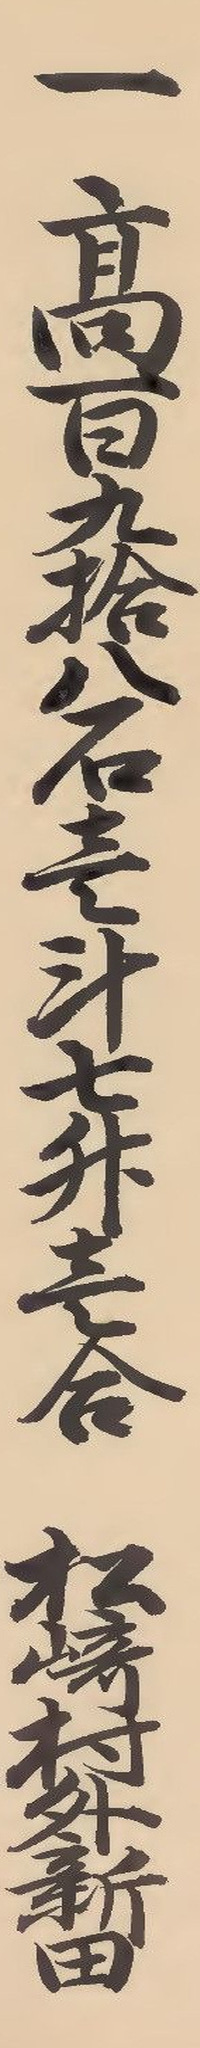一高百九拾八石壱斗七升壱合松崎村外新田
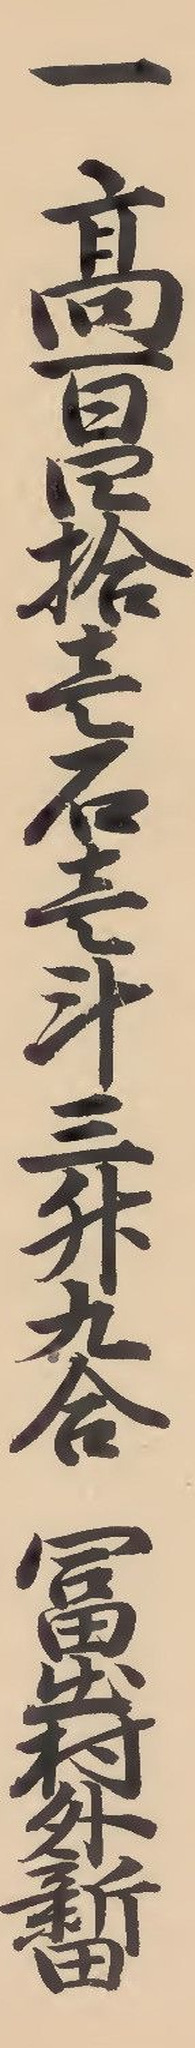一高百四拾壱石壱斗三升九合富出村外新田
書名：越後国郷帳　下
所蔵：国立公文書館 National Archives of Japan
